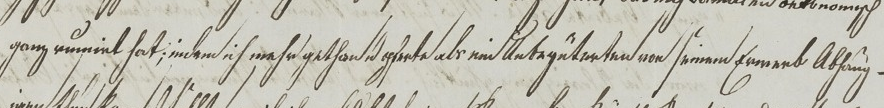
ganz ruinirt hat; indem ich mehr gethan u opferte als ein Unbegüterter von seinem Erwerb Abhäng-
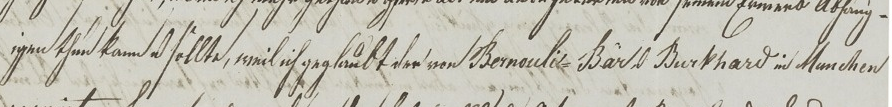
iger thun kann u sollte, weil ich geglaubt der von Bernouli-Bär u Burkhard in Munchen
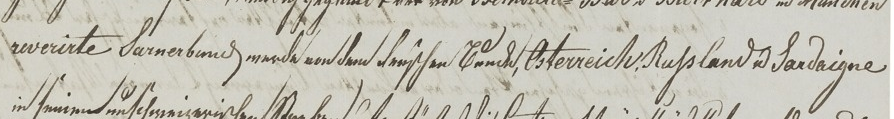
reverirte Sarnerbund werde von dem deuschen Bunde, Osterreich, Russland u Sardaigne
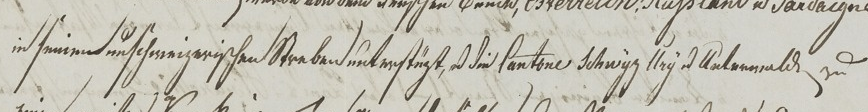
in seinem unschweizerischen Streben unterstüzt, u die Cantone SchwyzUry u Unterwalden
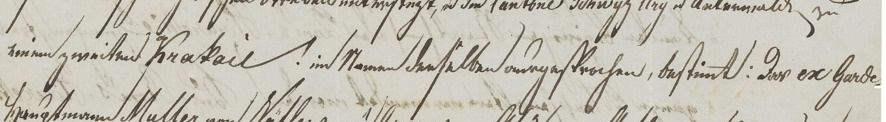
einem zweiten Krakau! im Namen derselben ausgesprochen, bestimmt: Das ex Garde
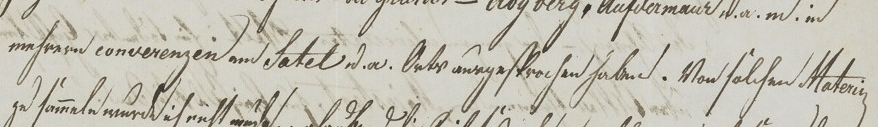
mehrern converenzen am Satel u. a. Orts ausgesprochen haben. Von solchen Materien
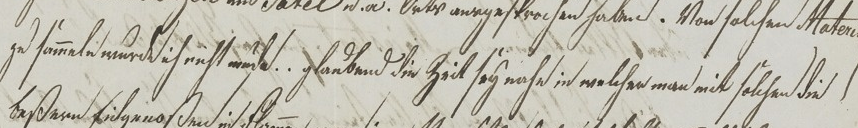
ich recht müde.. glaubend die Zeit sey nahe in welcher man mit solchen die
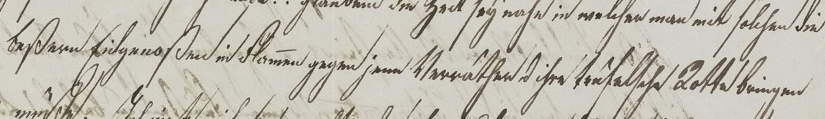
beßern Eidgenoßen in Flammen gegen jene Verräther u ihre teufelsche
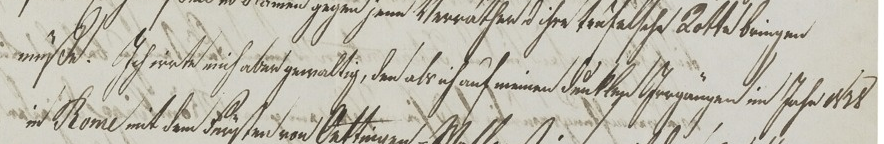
müße. Ich irrte mich aber gewaltig, den als ich auf meinen dunklen
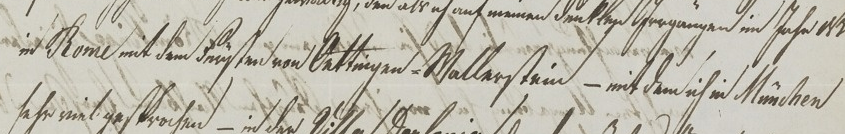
mit dem Fürsten von Oettingen-Wallerstein – mit dem ich in
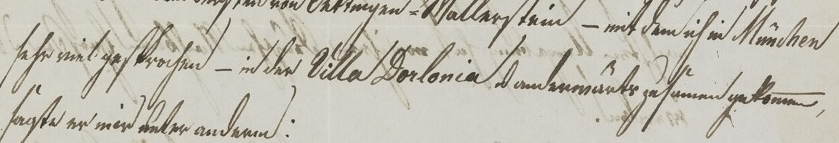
sehr viel gesprochen – in der Villa Dorlonia u anderwärts
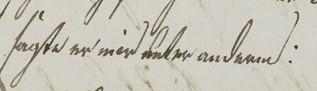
sagte er mir unter anderm:
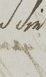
der
